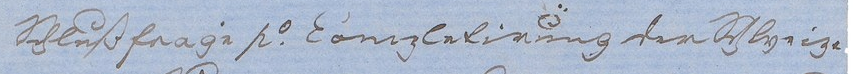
Schlußfrage po Completirung der Schweize-
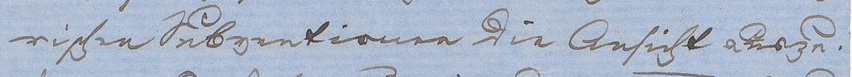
rischen Subventionen die Ansicht auszu-
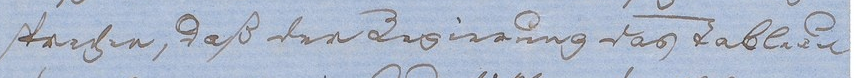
sprechen, daß der Regierung das Tableau
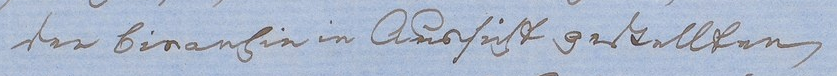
der bisanhin in Aussicht gestellten
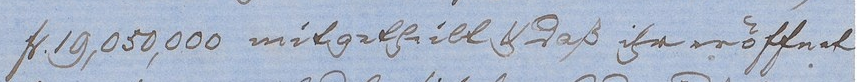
fr. 19,050,000 mitgetheilt & daß ihr eröffnet
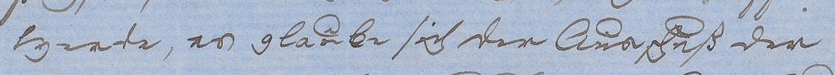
werde, es glaube sich der Ausschuß der
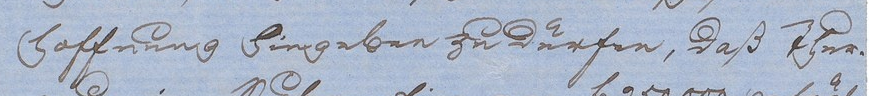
Hoffnung hingeben zu dürfen, daß Thur-
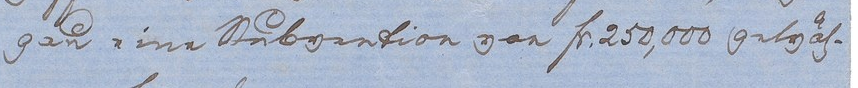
gau eine Subvention von fr. 250,000 gewäh-
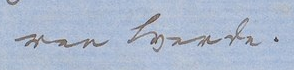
ren werde.
